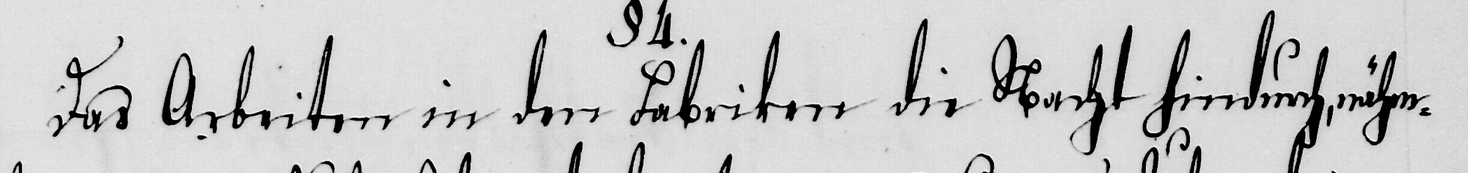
Das Arbeiten in den Fabriken die Nacht hindurch, näh¬
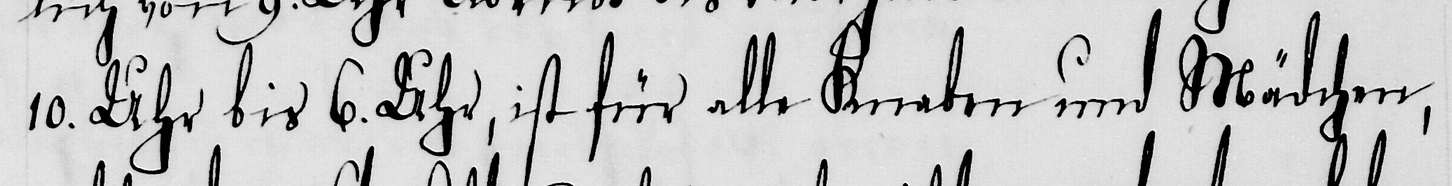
10. Uhr bis 6. Uhr, ist für alle Knaben und Mädchen,
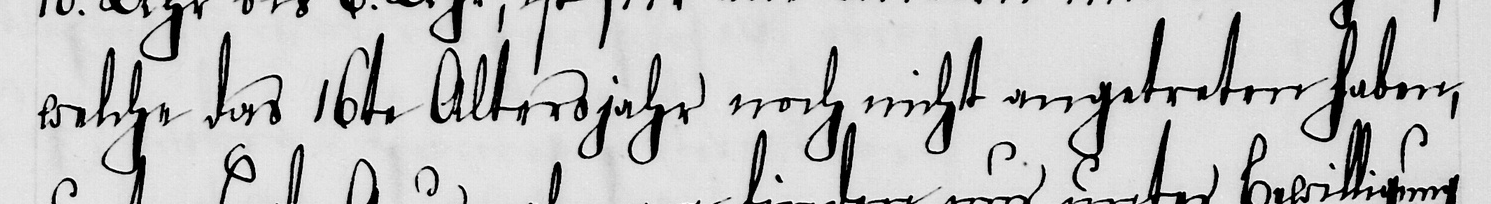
welche das 16te Altersjahr noch nicht angetreten haben,
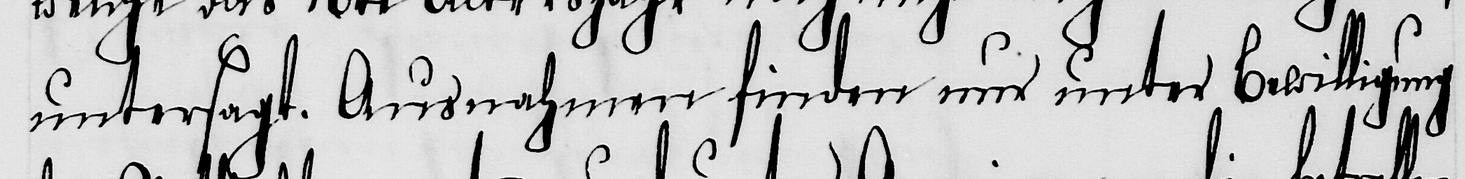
untersagt. Ausnahmen finden nur unter Bewilligung
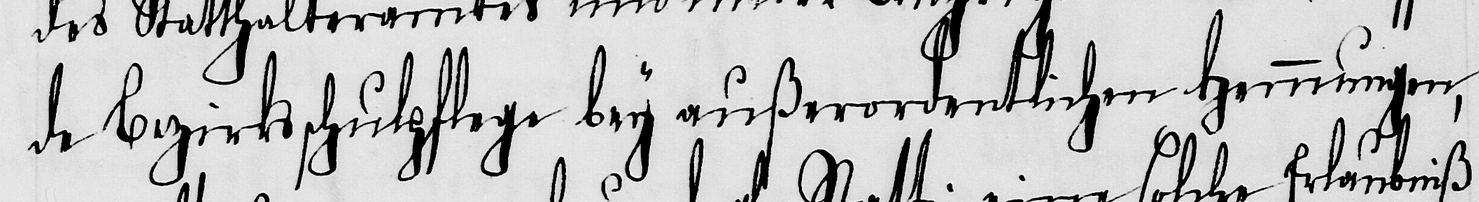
de Bezirksschulpflege bey außerordentlichen Hemmungen,
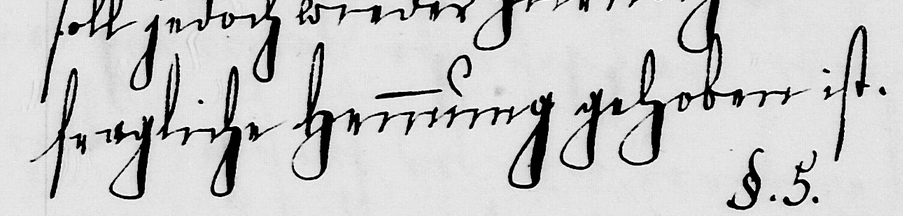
fragliche Hemmung gehoben ist.
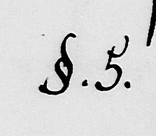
§. 5.
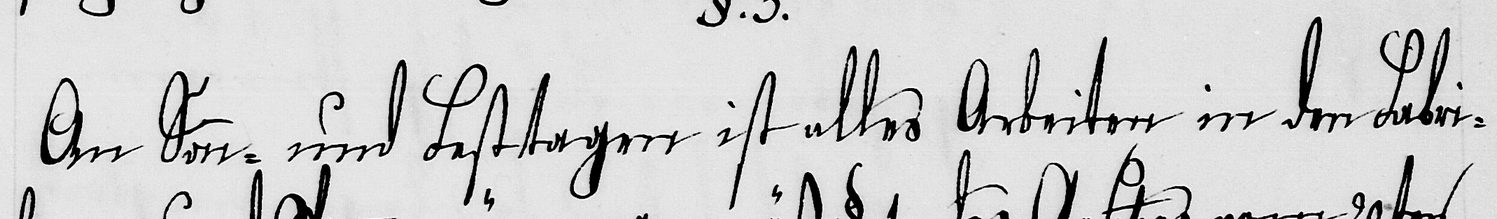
Sonn- und Festtagen ist alles Arbeiten in den Fab¬
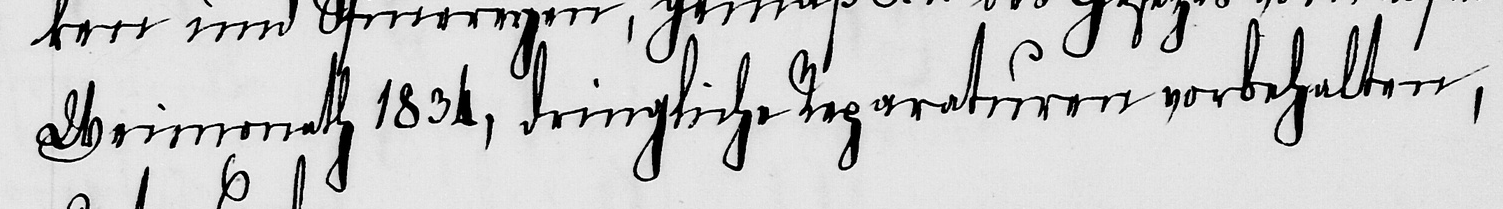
Weimonath 1834, dringliche Reparaturen vorbehalten,
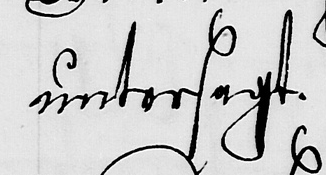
untersagt.
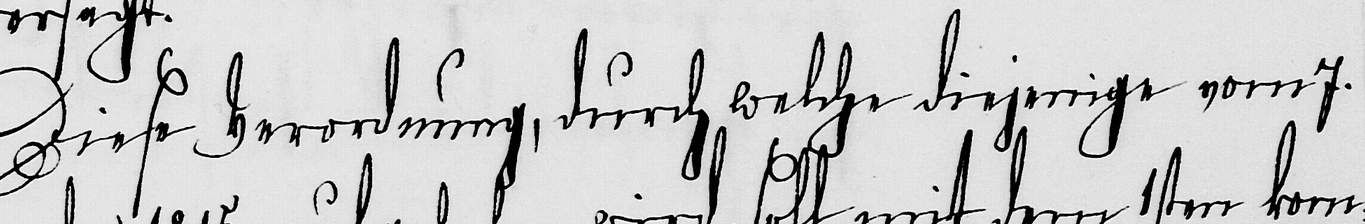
Diese Verordnung, durch welche diejenige vom 7.
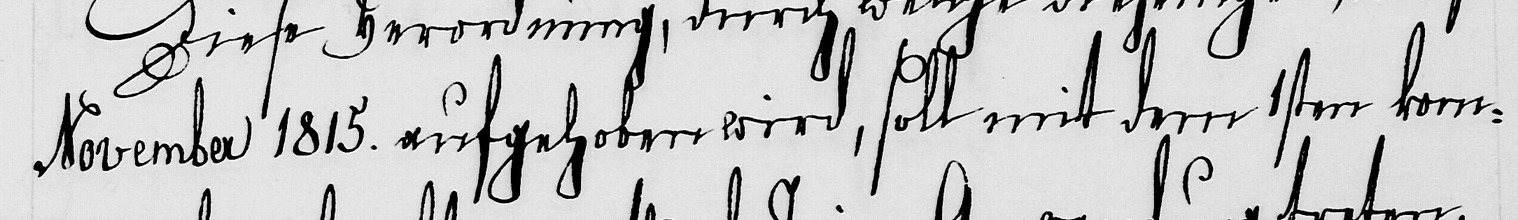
November 1815. aufgehoben wird, soll mit dem 1sten kom¬
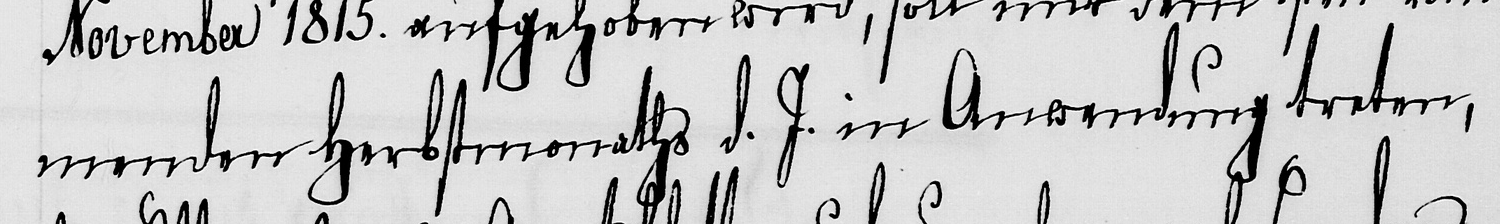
menden Herbstmonaths d. J. in Anwendung treten,
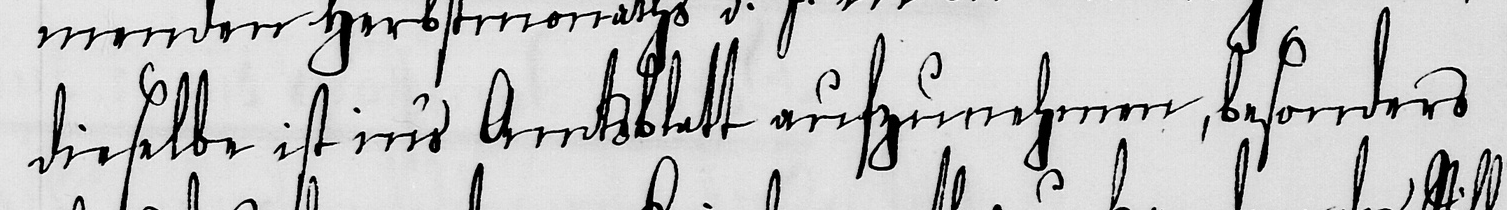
dieselbe ist ins Amtsblatt aufzunehmen, besonders
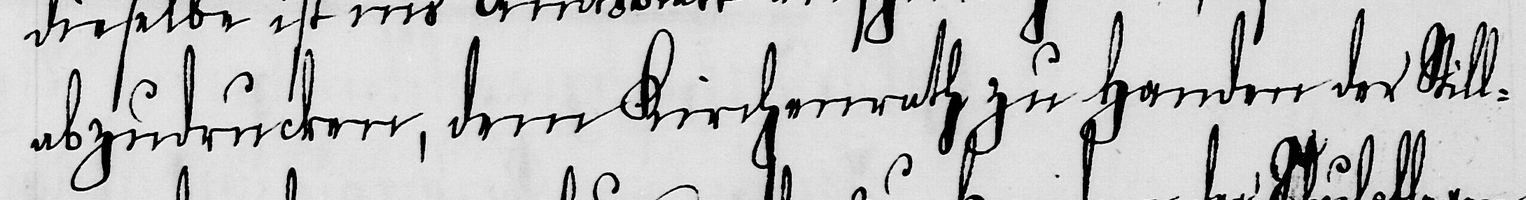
abzudrucken, dem Kirchenrath zu Handen der Stil¬
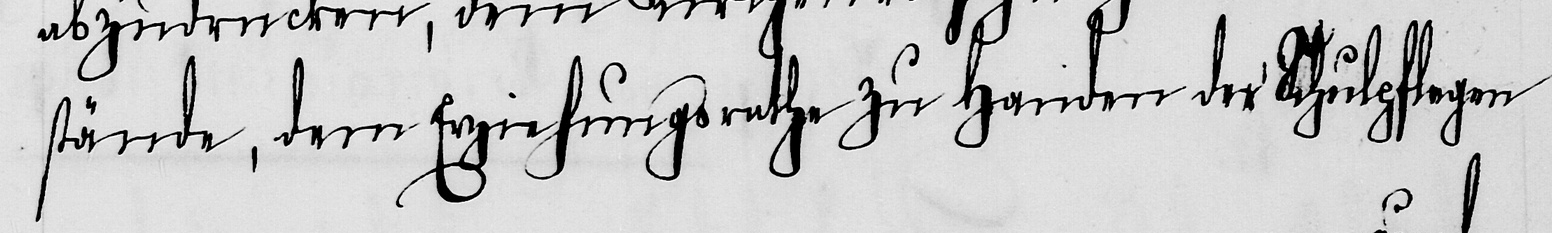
lstände, dem Erziehungsrathe zu Handen der Schulpflegen
